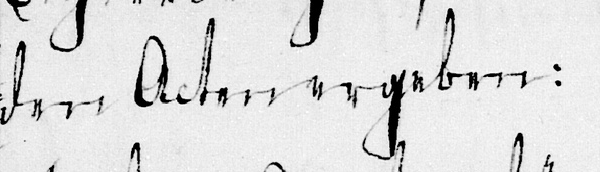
den Acten ergeben:
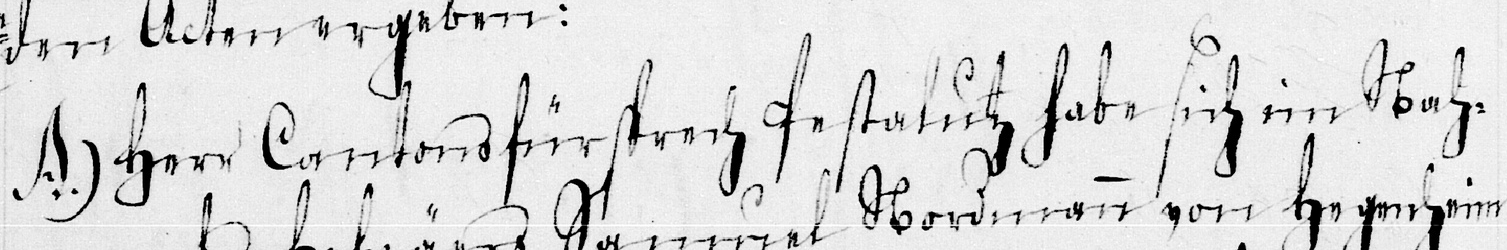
A.) Herr Cantonsfürsprech Pestalutz habe sich im Nah¬
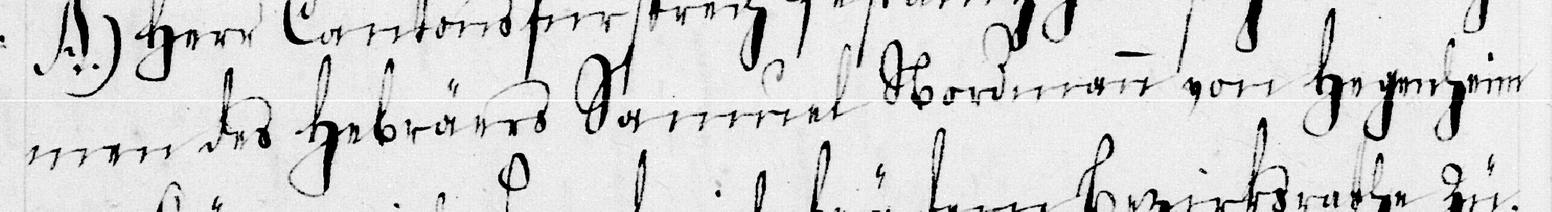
men des Hebräers Samuel Nordmann von Hegenheim
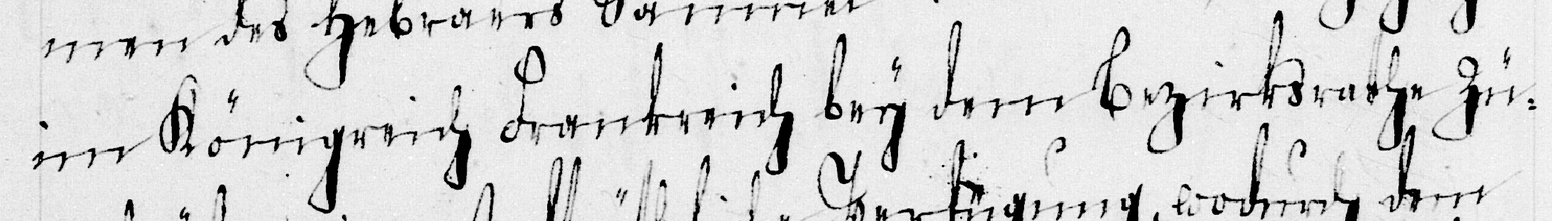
im Königreich Frankreich bey dem Bezirksrathe Zü¬
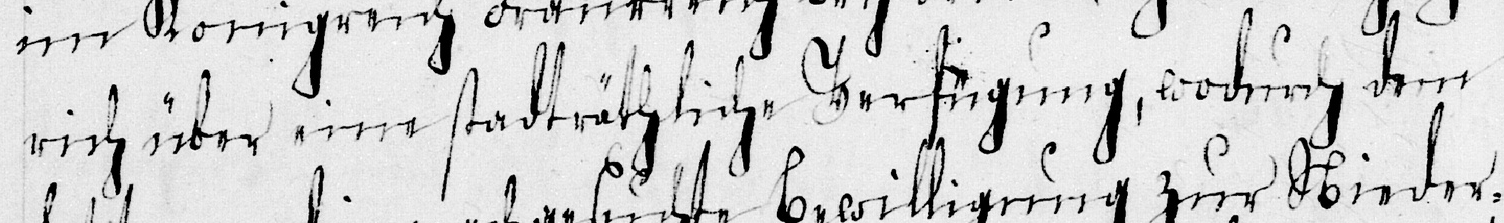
rich über eine stadträthliche Verfügung, wodurch dem
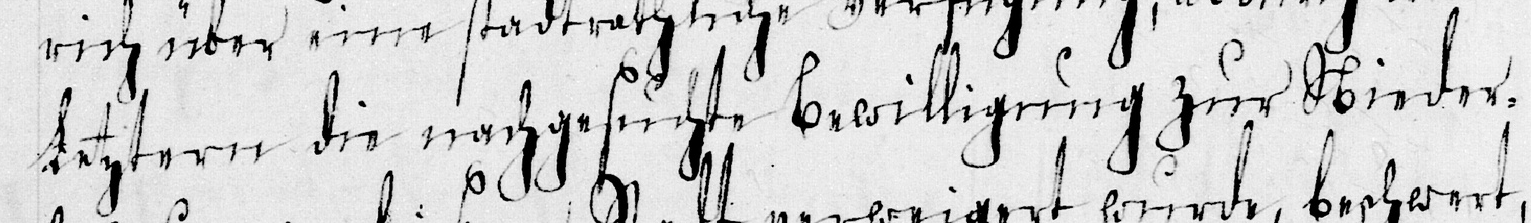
Letztern die nachgefragte Bewilligung zur Nieder¬
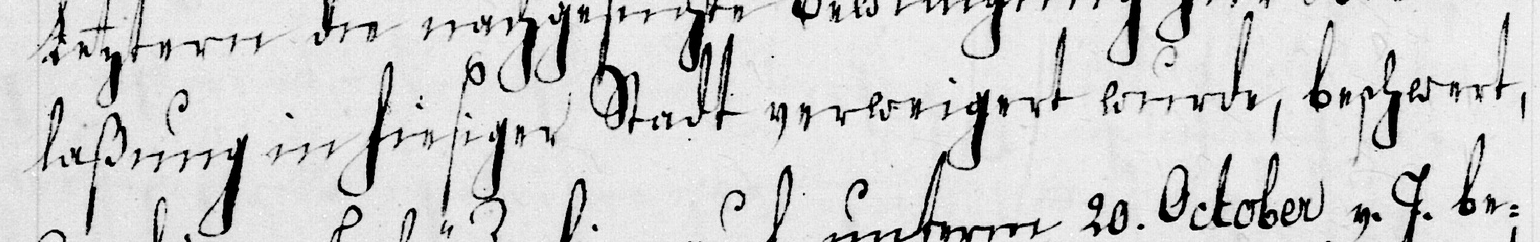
laßung in hiesiger Stadt verweigert wurde, beschwert,
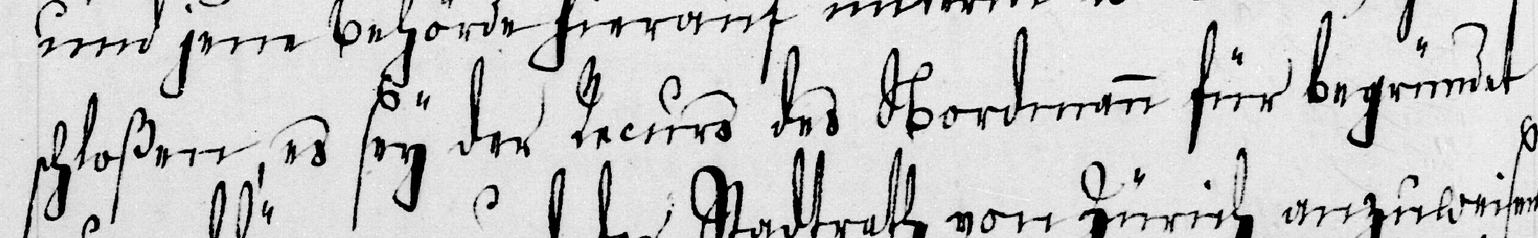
schloßen, es sey der Recurs des Nordmann für begründet
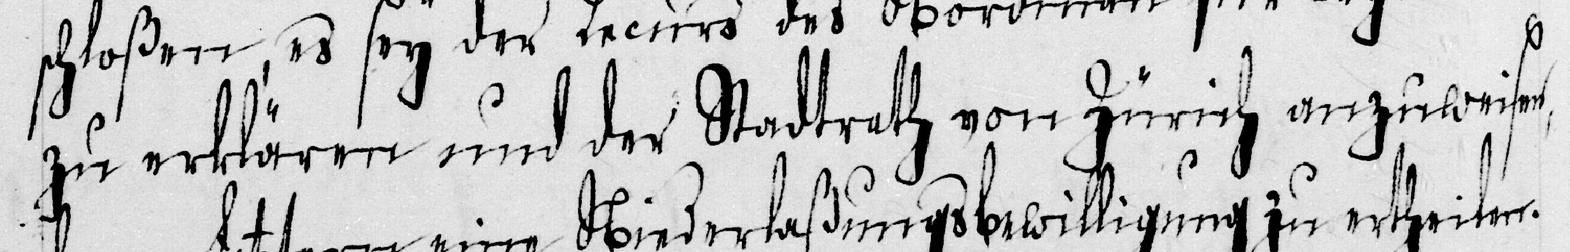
zu erklären und der Stadtrath von Zürich anzuweisen,
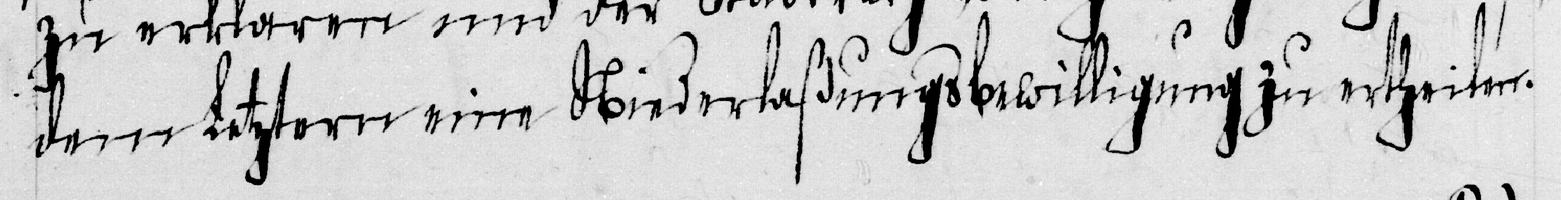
dem Letztern eine Niederlaßungsbewilligung zu ertheilen.
